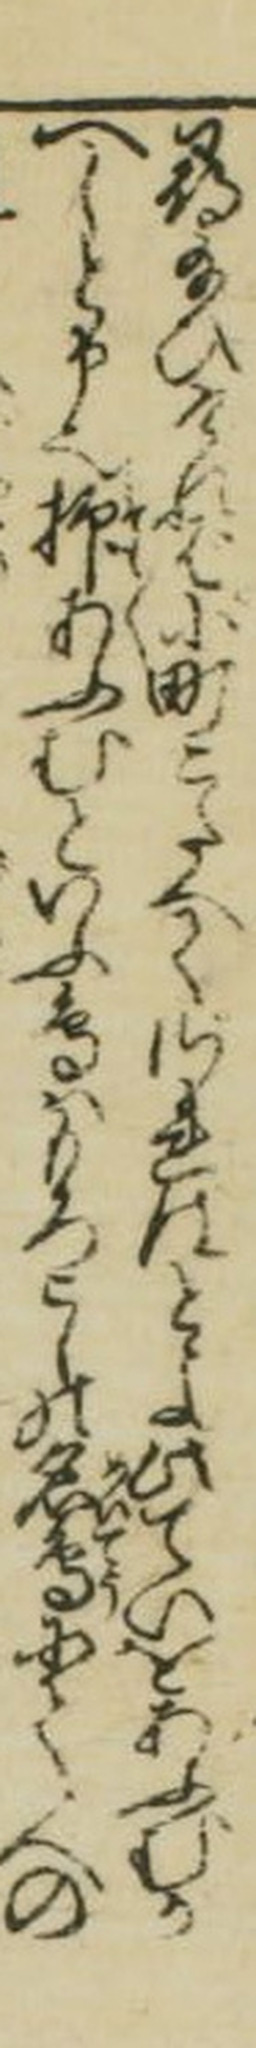へしと申也抑あふむといふ鳥はもろこしの名鳥にて人の
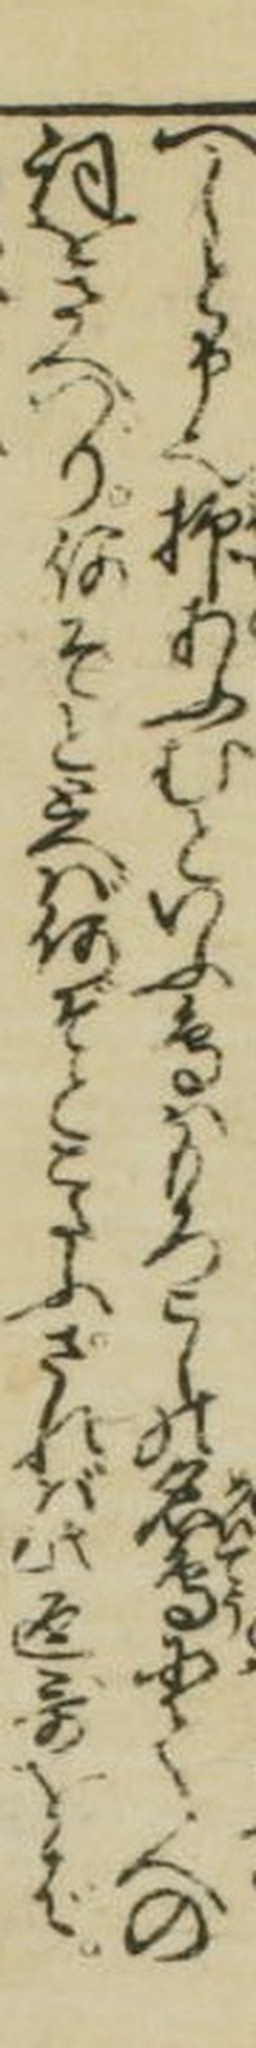詞をさへつり。何そととへば何ぞとこたふ。されば此返哥をば。
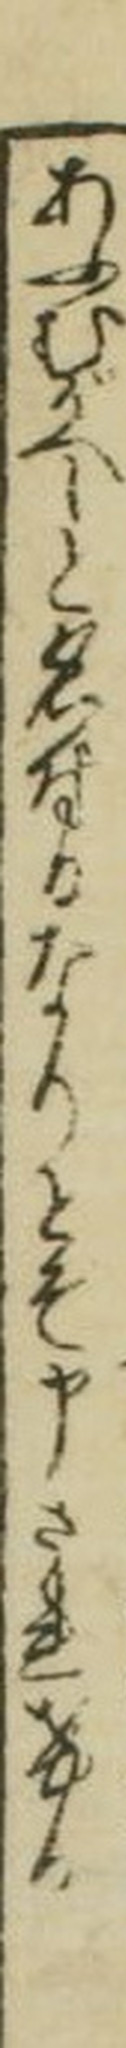あふむがへしと名付るなりとそ申されける
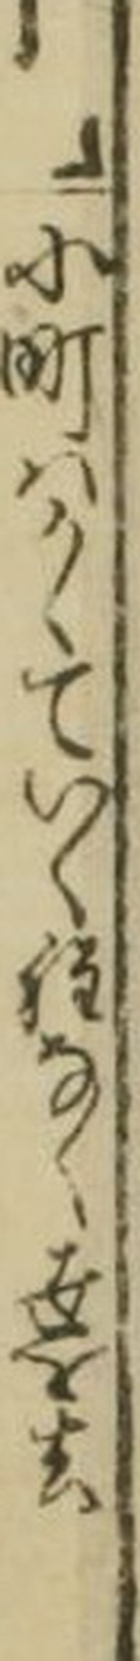小町はかくていく程なく世を去
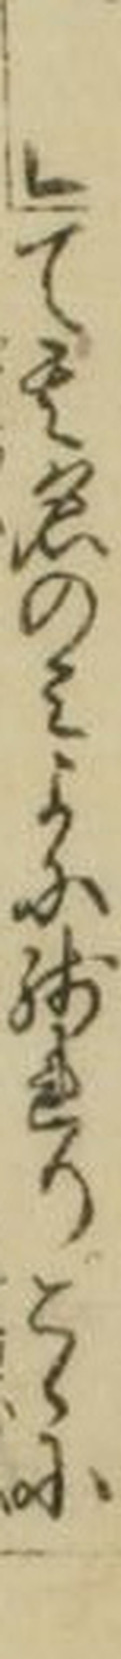て其名のみよに残れり。とくに
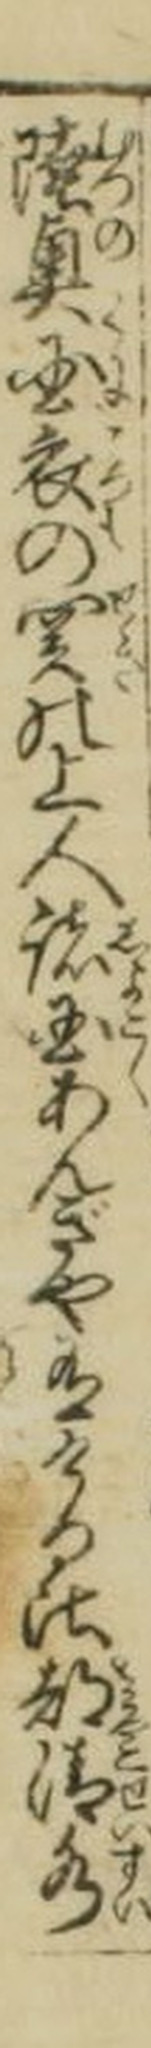陸奥国衣の関の上人諸国あんぎや有ける比。都清水
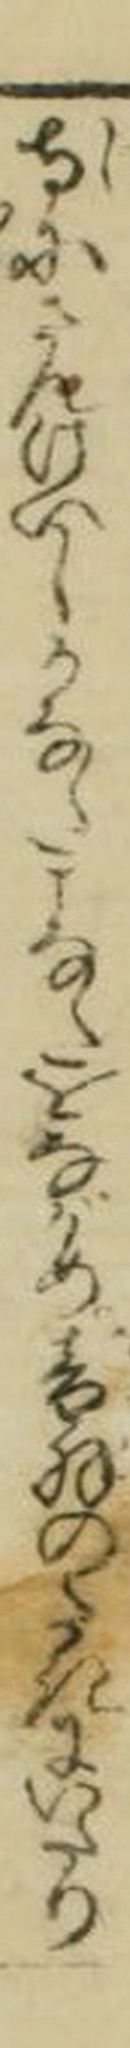寺にさんけいしかなたこなたをながめ。音羽のたきにいたり
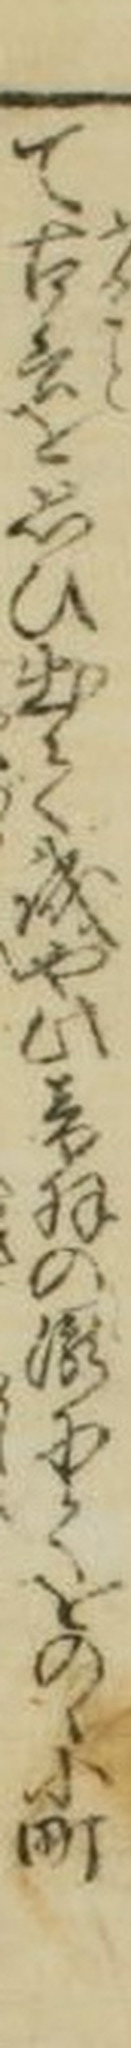て古言を思ひ出て。誠や此音羽の瀧にてをのゝ小町
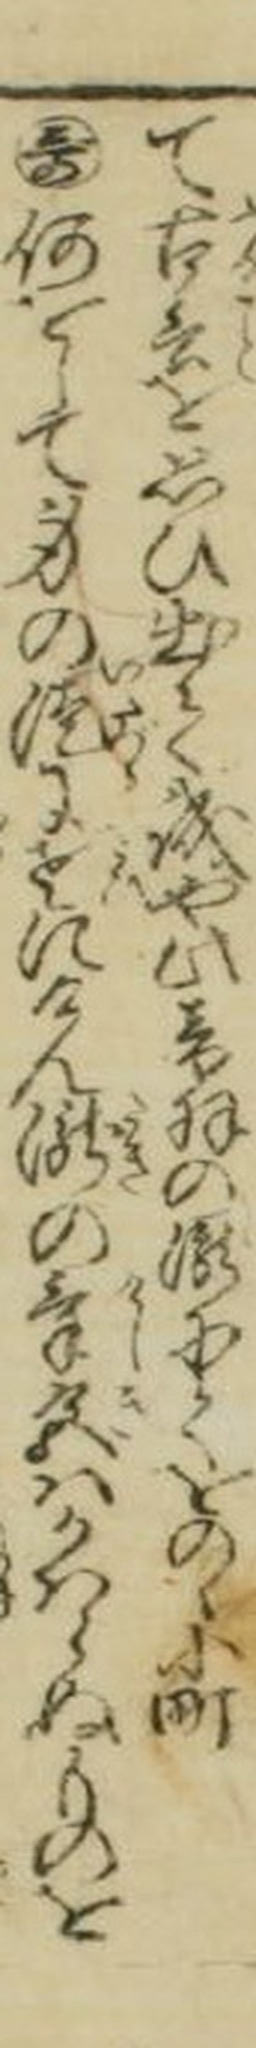哥何をして身の徒に左にけん瀧の景色はかはらぬものを
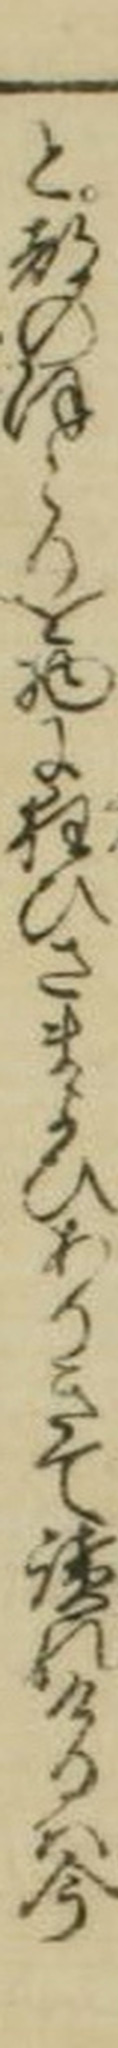と。都のほとりを物に狂ひさまよひありきて読れけるは。今
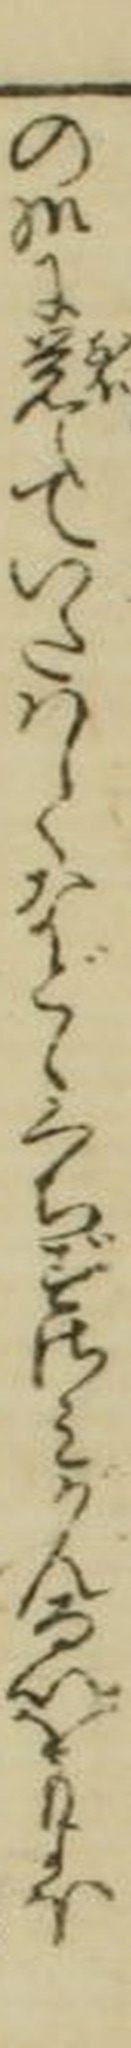の様に覚えていたはしくなどゝくちずさみ。かんるいをもよほ
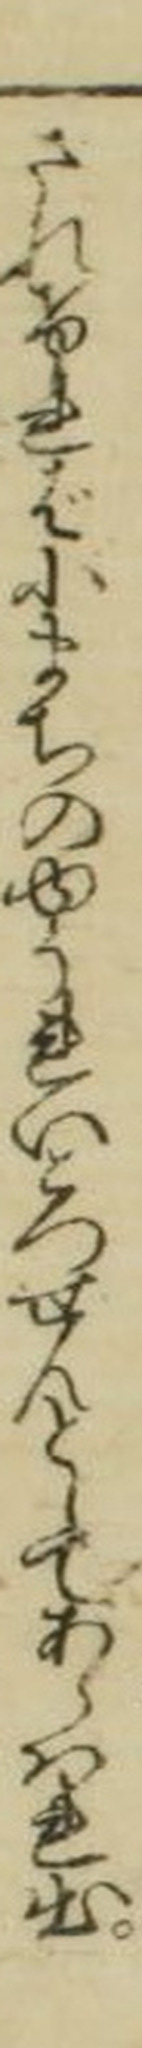されければ。小まちのゆうれいこつせんとしてあらはれ出。
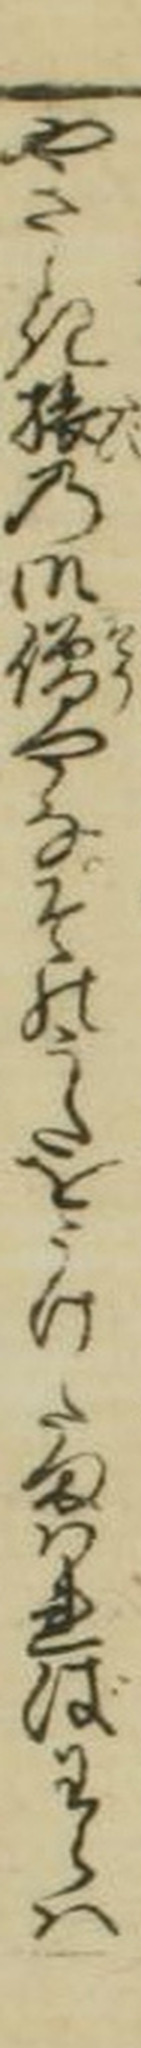やさしき旅の御僧やな。そのうたをうけたまはればわらは
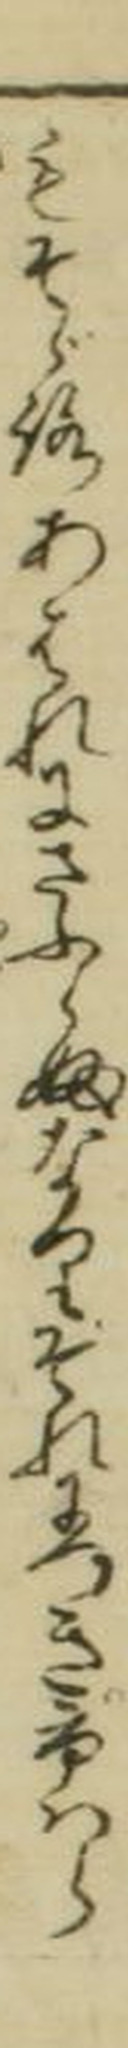もそゞろあはれにさふらふなりそれにつき。市はら
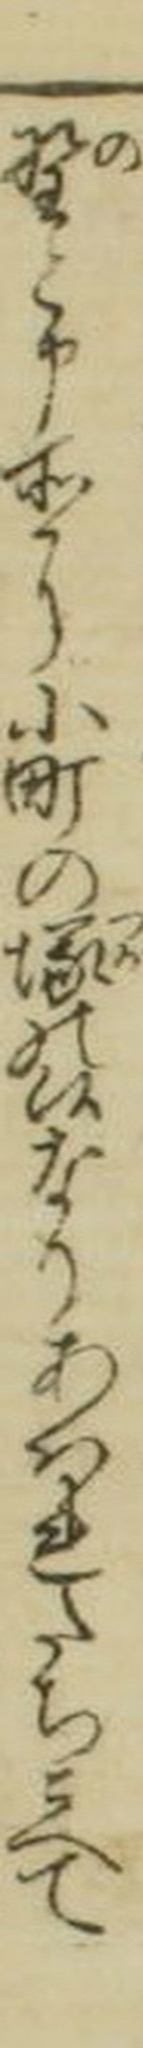野と申所に小町の塚の候なりあはれたちこへて
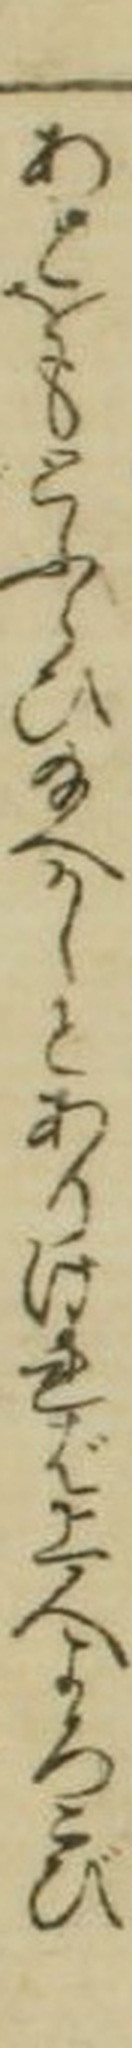あとをもとふらひ給へかしとありければ上人よろこび
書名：女源氏教訓鑑
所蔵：東京学芸大学附属図書館
